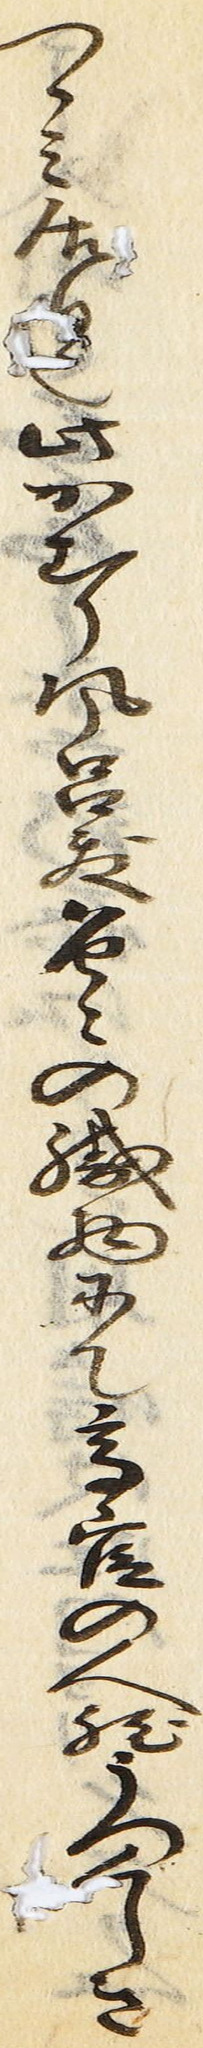つゝみ居る也此かむり風呂敷色々の織物にて高官の人程うつくしき
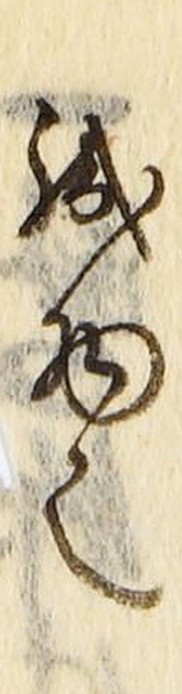織物也
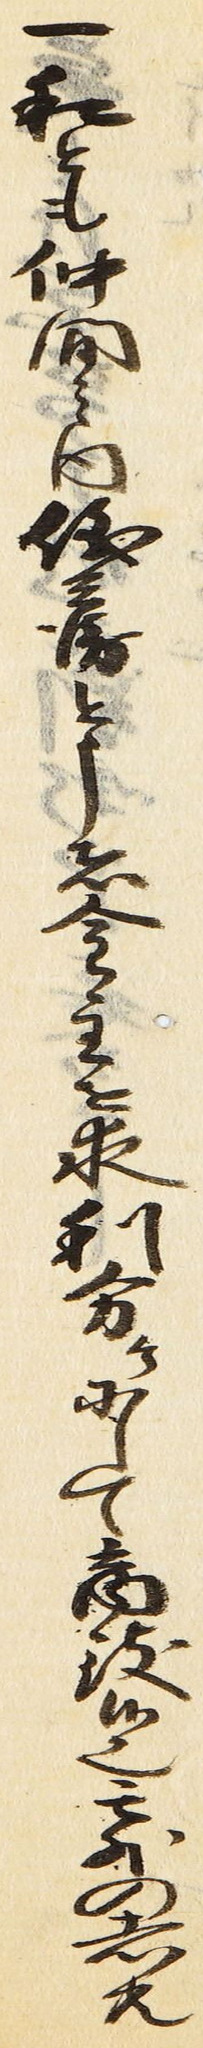一私とも仲間之内儀兵衛と申者金主をもと求利分けにして商致也其外の者共
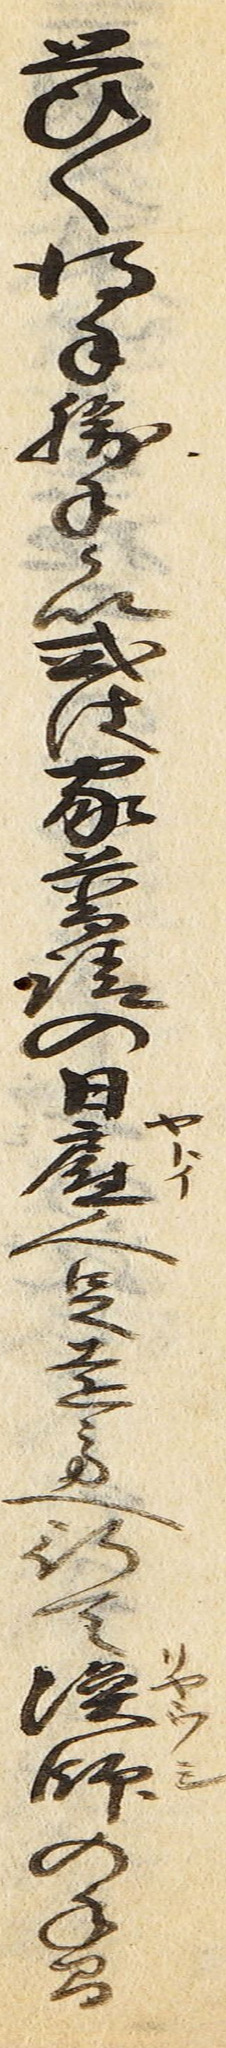思ひ〳〵得手勝手に以或は家普請の日雇人足遠方へ行て漁師の手間
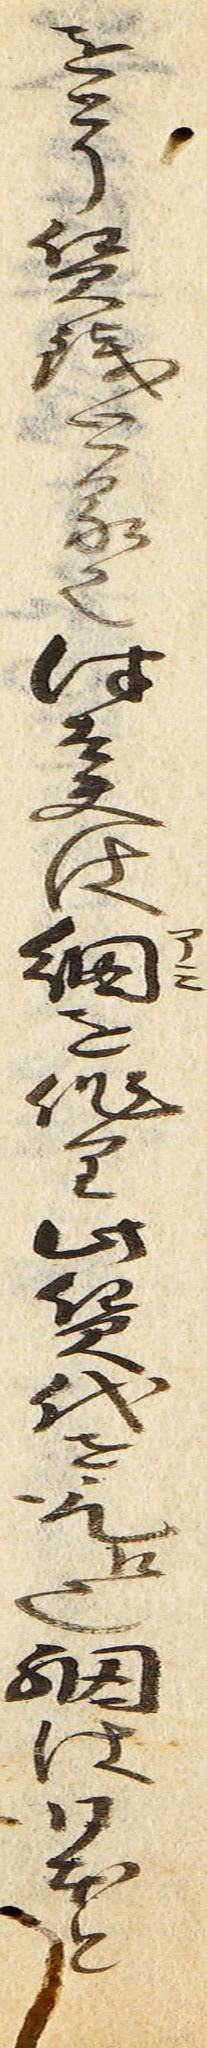をとり賃銭とる也伴太夫は網を作り此賃代を取る也網は日本と
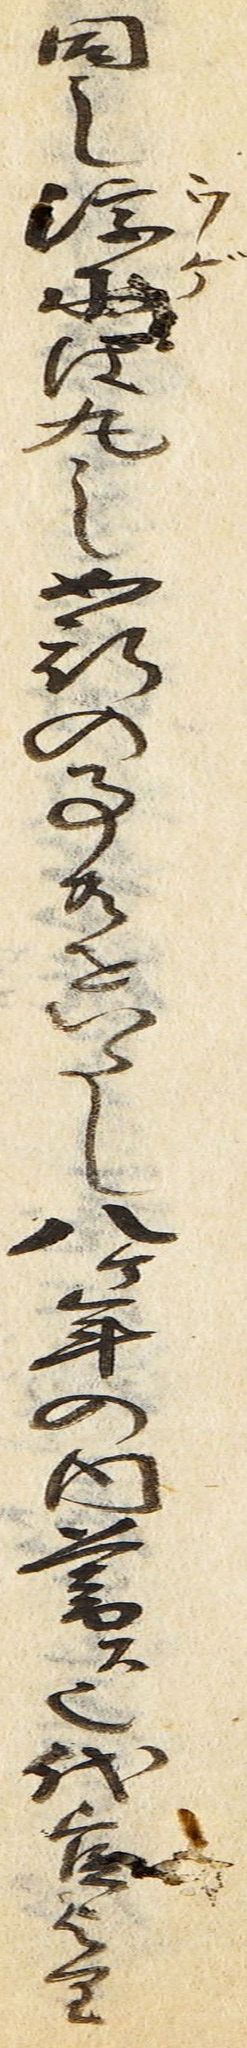同し浮木は丸し如斯の事共をいたし八ヶ年の内暮す也代官より
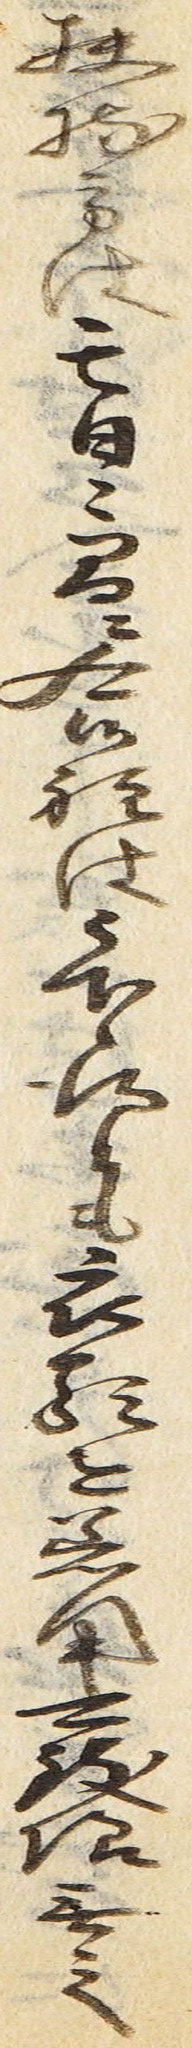扶持方は其日に間に合候程は被下候得とも衣類を着用可致限無之
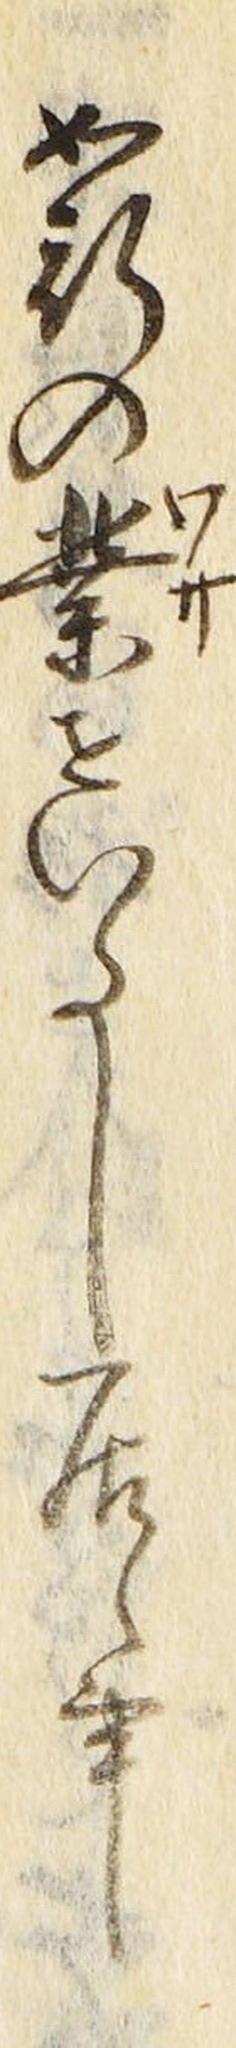如斯の業をいたし居候事
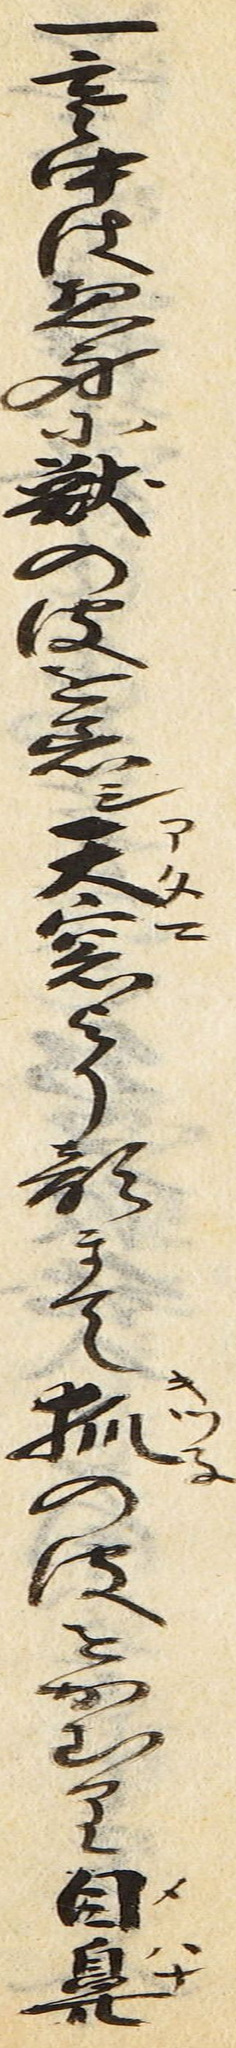一寒中は惣身に獣の皮を着し天窓より顔まて狐の皮をかむり目鼻
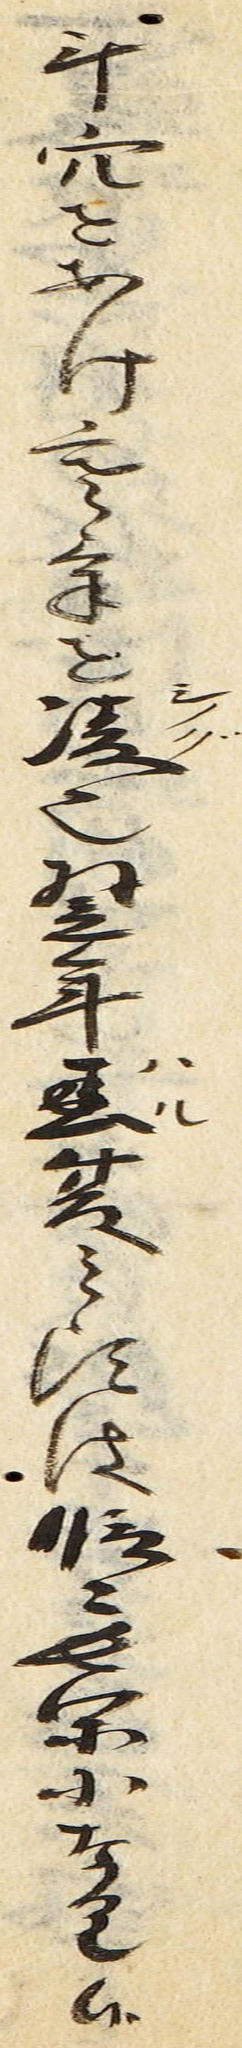計穴をあけ寒気を凌也翌年春夏之頃は段々長閑になり候
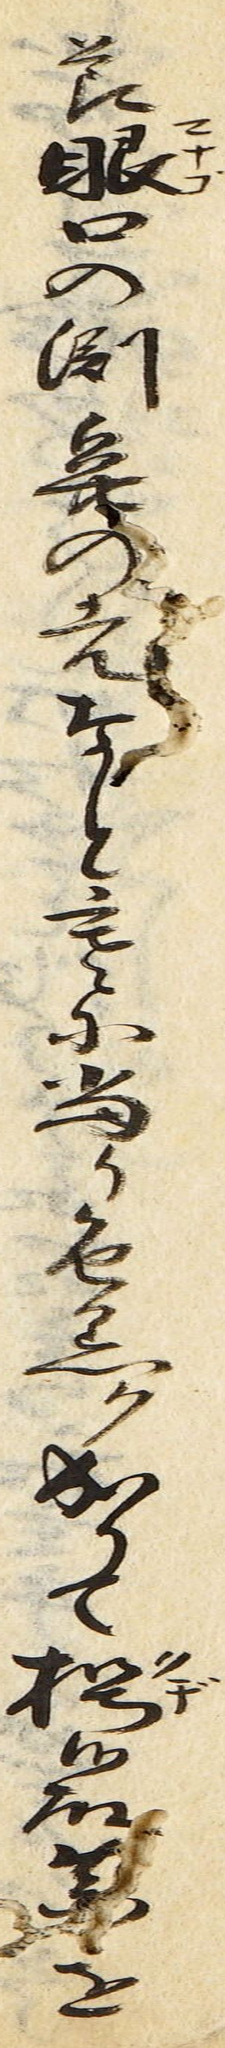節眼口の淵鼻の先なと寒に当り色黒く成りて朽候故薬を
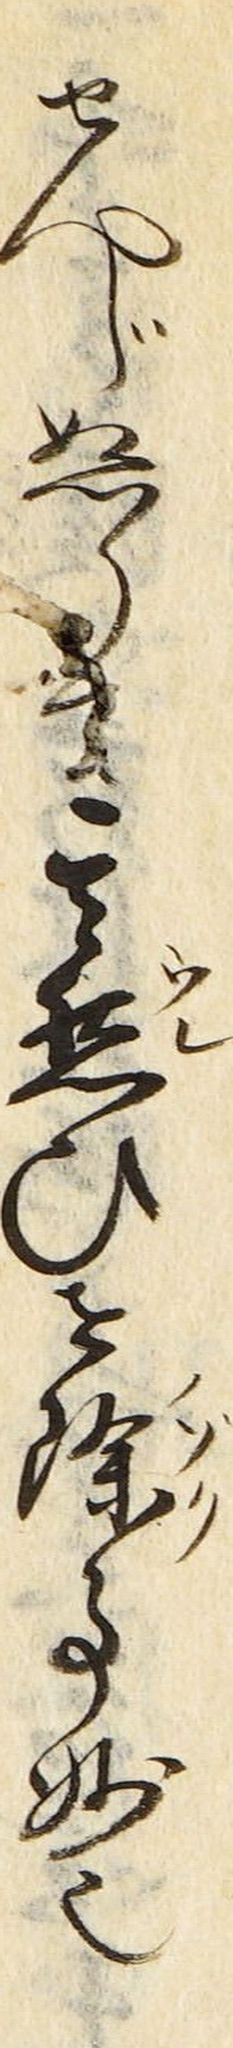せんじぬりて其愁ひを除事妙也
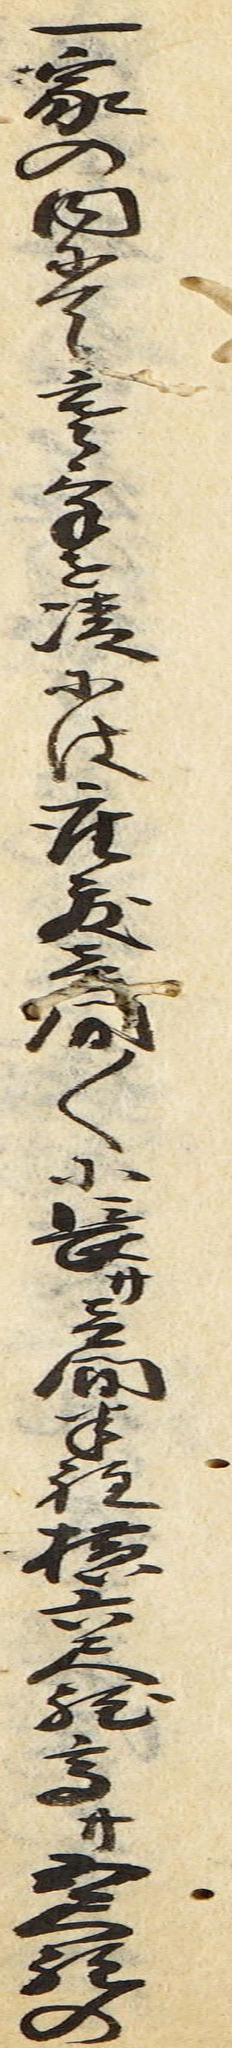一家の内にて寒気を凌には座敷壱間〳〵に長さ壱間半程横六尺程高さ五尺程の

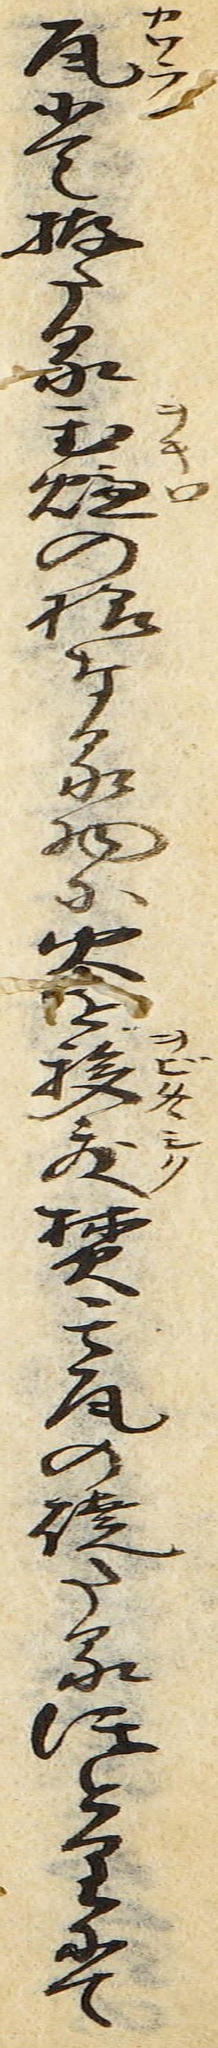瓦にて拵たる置爐の様なる物に火を夥敷焚其瓦の焼たるほとりにて
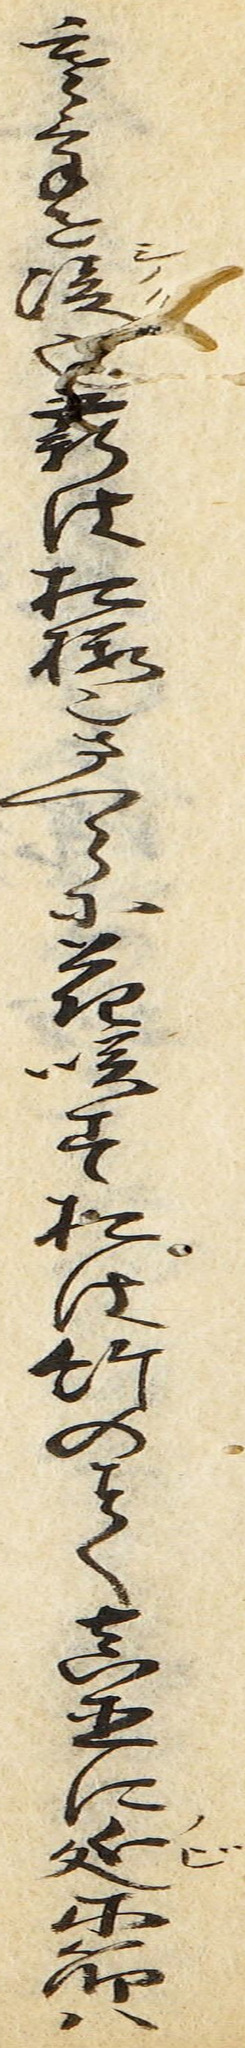寒気を凌也薪は松桜也さくらに花咲す松は竹のことく真直に延木筋は
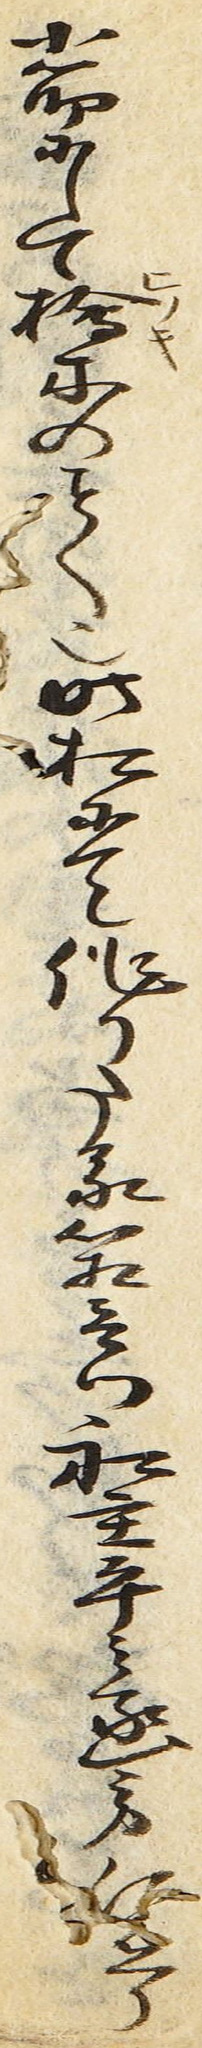小筋にして桧木のことく也此松にて作りたる箱壱つ船主平之丞方有り
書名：外国漂流記
